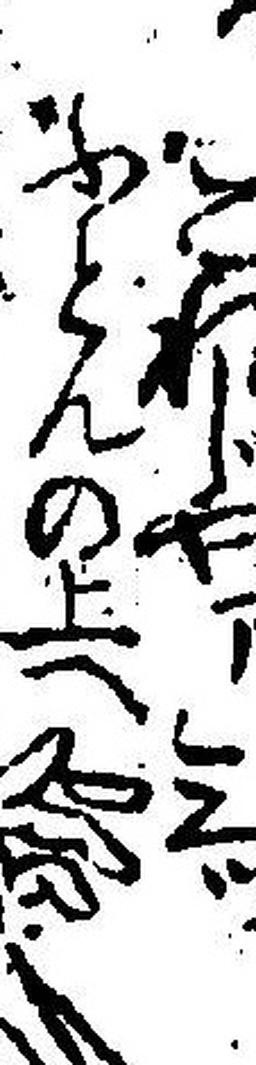ふとんの上へ
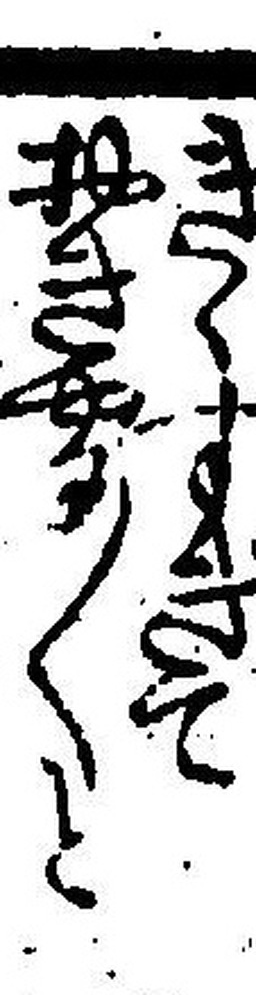おきやァ〳〵と
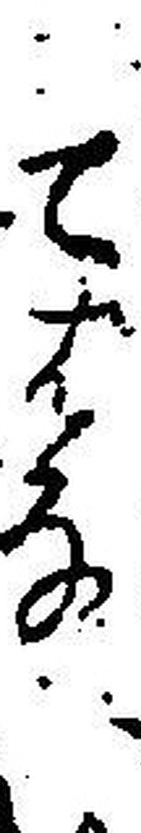てはな
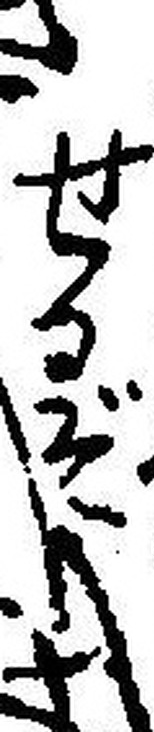せるぞ
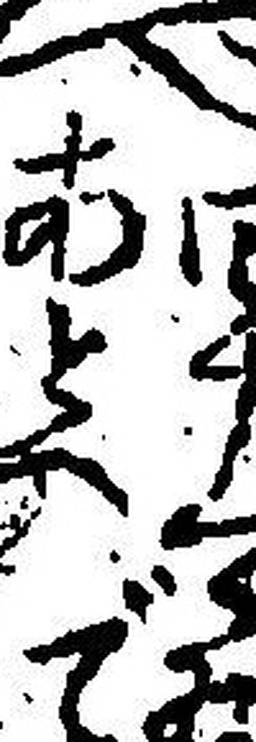あとへ
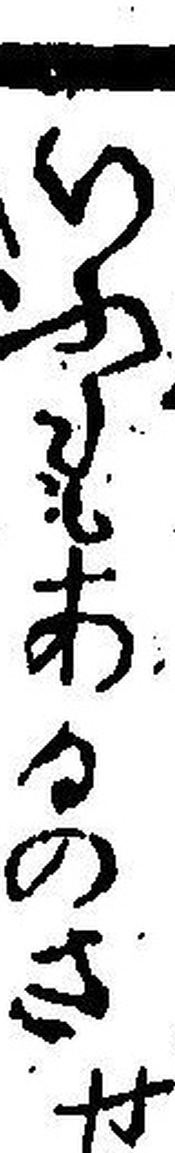いふもあるのさ
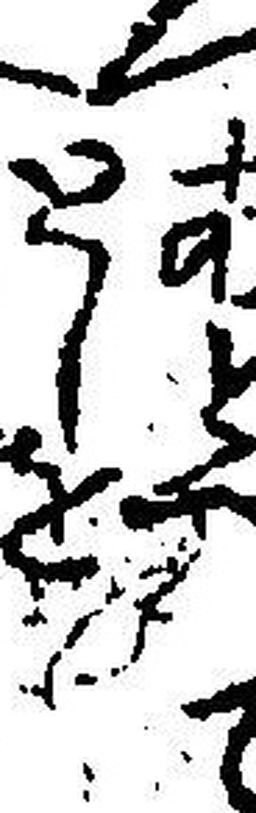としを
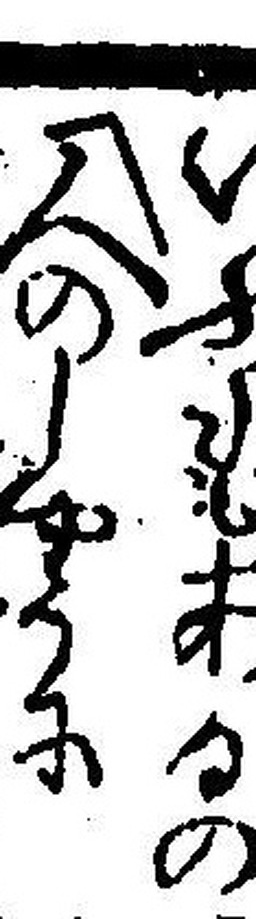〽人のしやうに
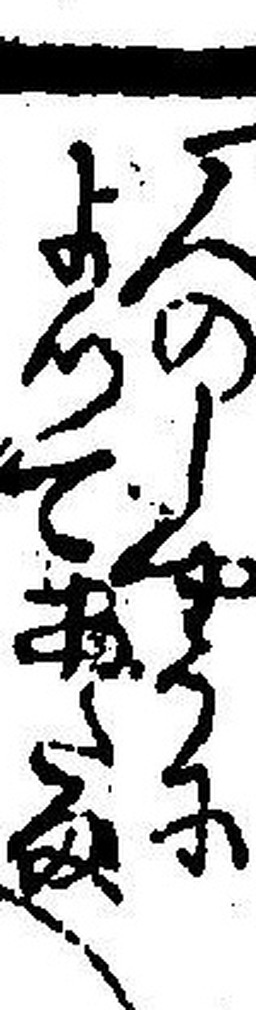よつてあたま
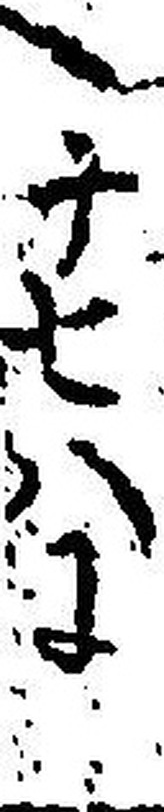十七八に
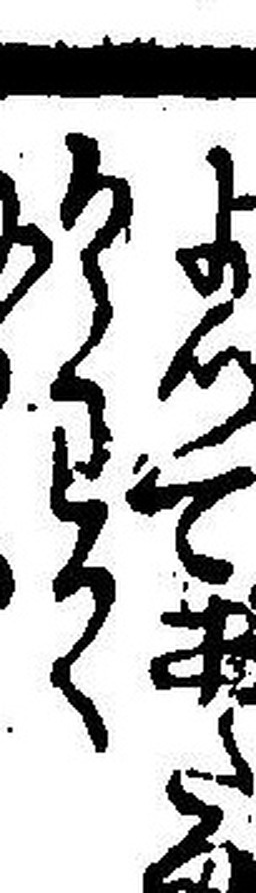からわかく
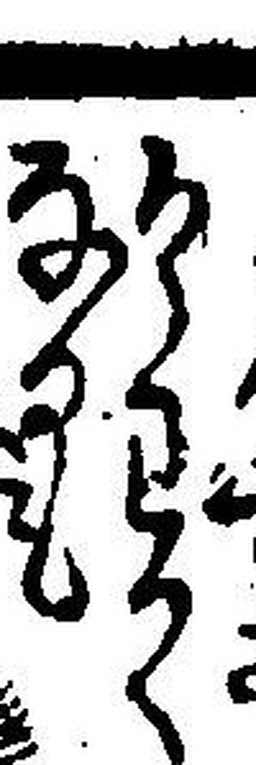なるも
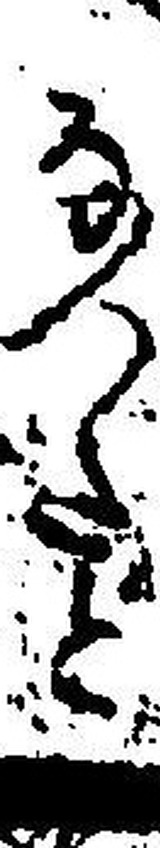なつたと
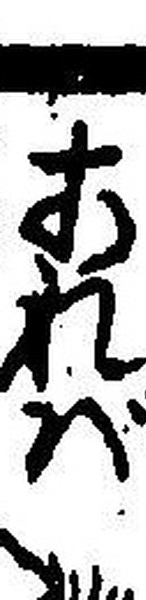あれば
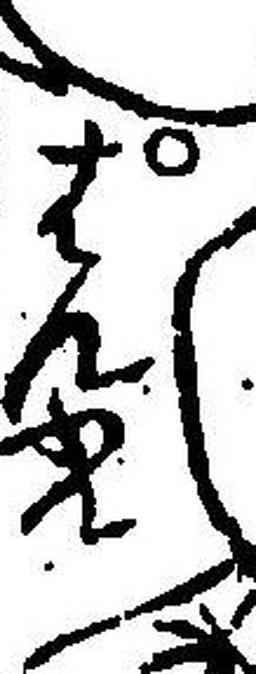○はんふん
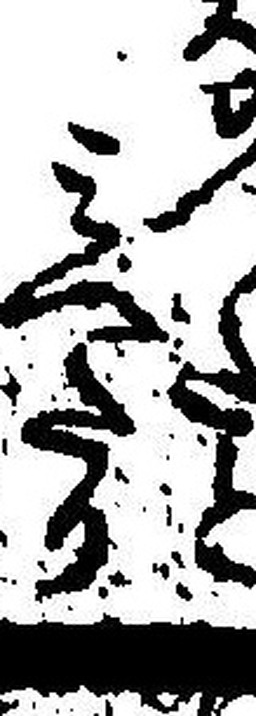みへたり
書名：徳若水縁起金性 / 樹下石上作
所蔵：東京大学総合図書館 General Library in the University of Tokyo, JAPAN
